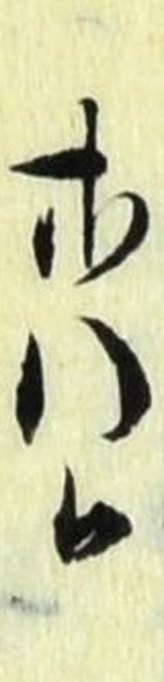廿八日
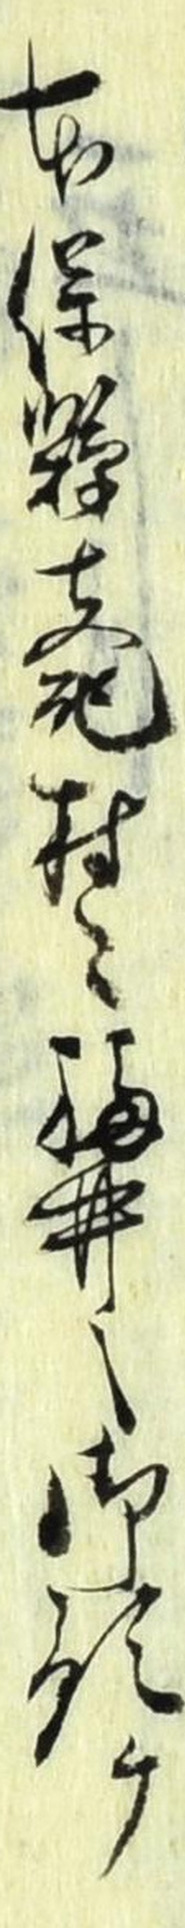本保県支配村々福井へ御預け
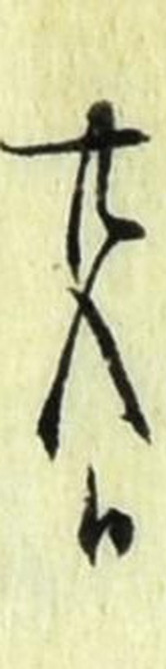廿八日
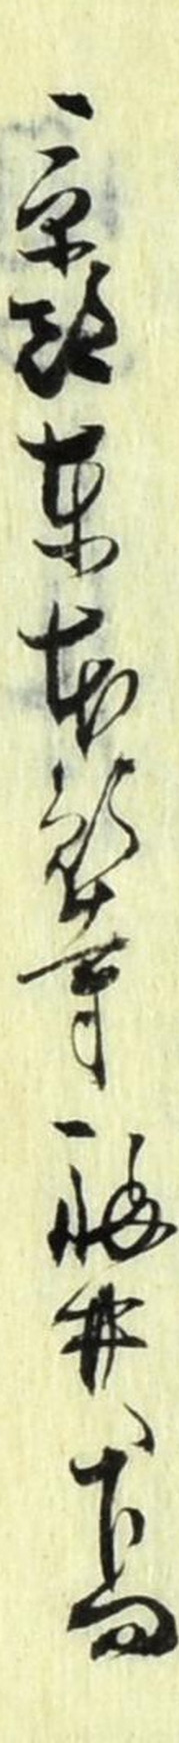京都東本願寺福井へ下向

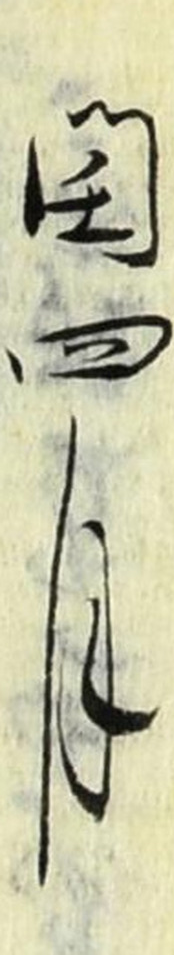閏四月
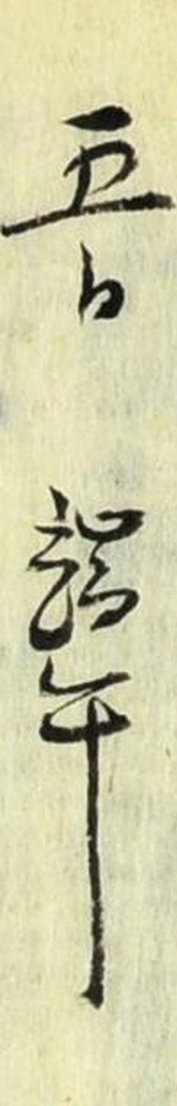五日端午
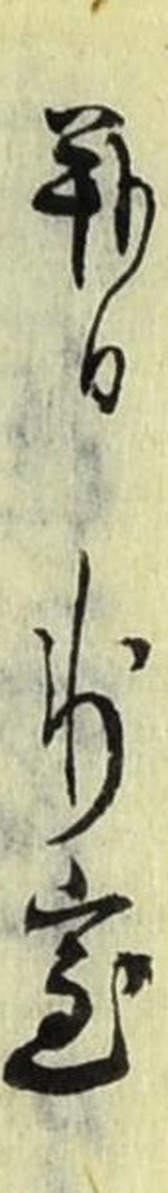朔日氷室
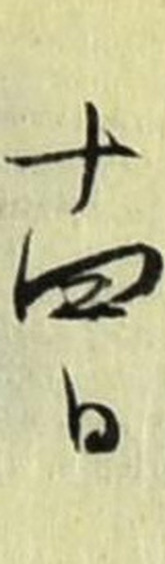十四日
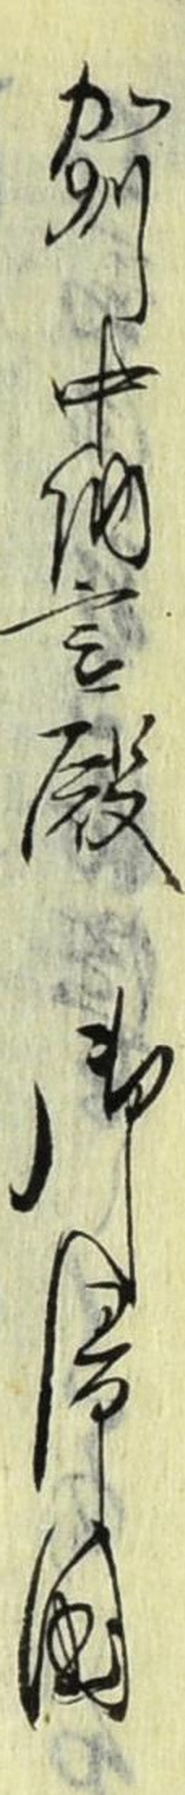加州中納言殿御帰国
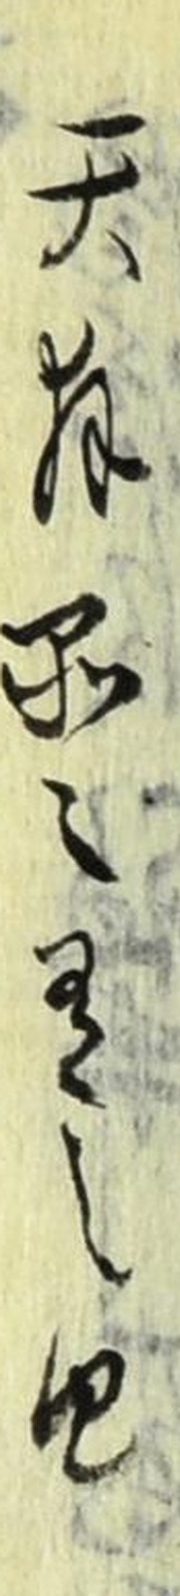天拝品々有之由

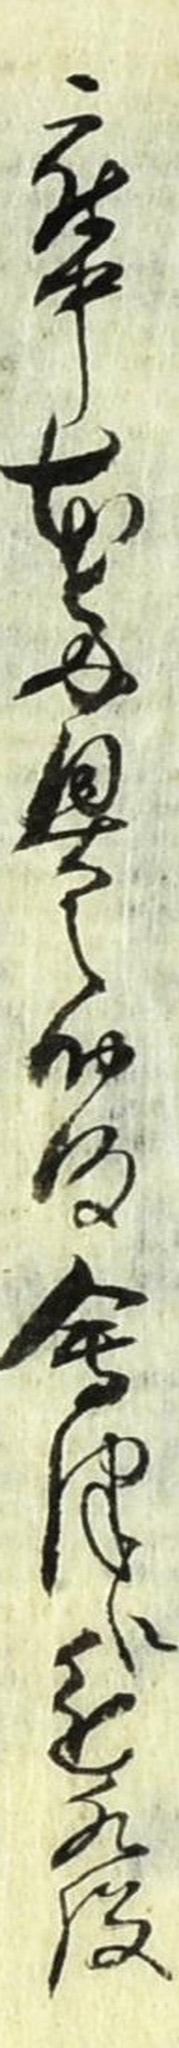府中本多興之助殿会津え進発
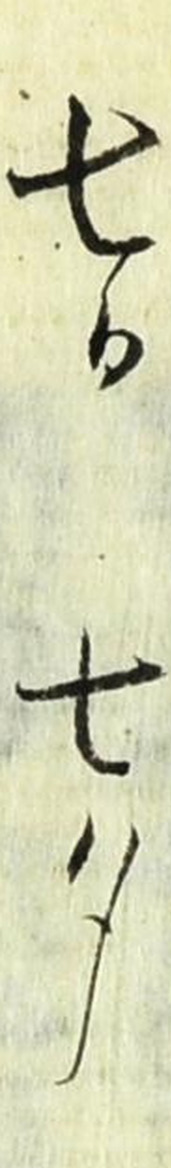七日七夕
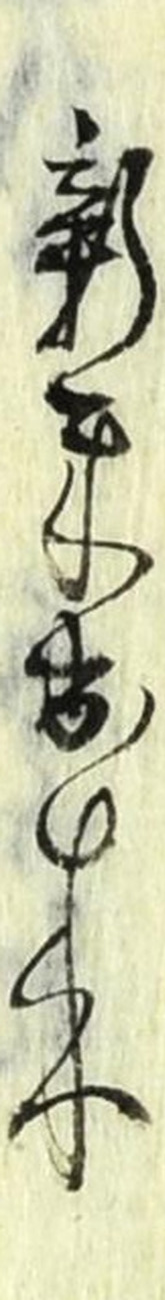新米出来
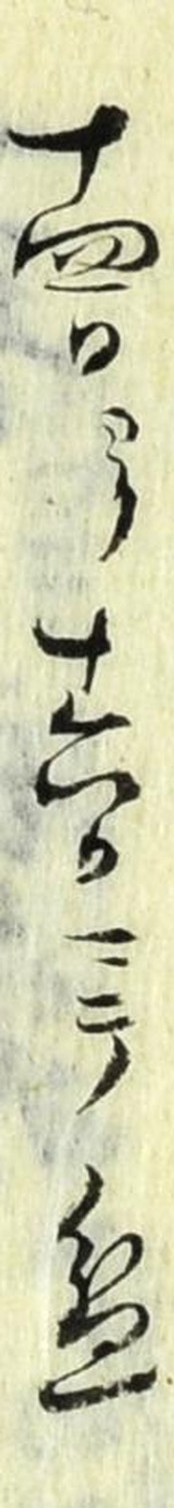十四日より十六日まて盆
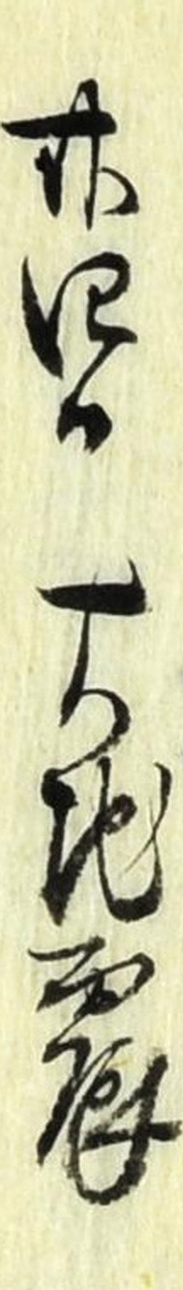廿四日大地震

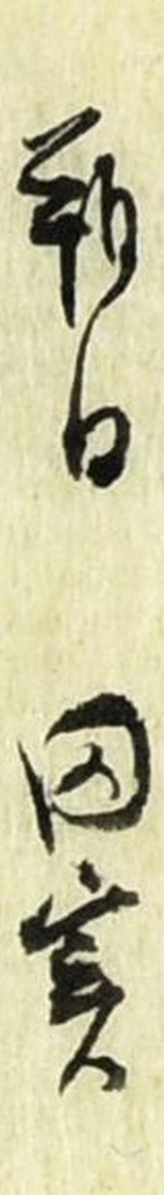朔日田実
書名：（日記）
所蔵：福井県文書館 Fukui Prefectural Archives
